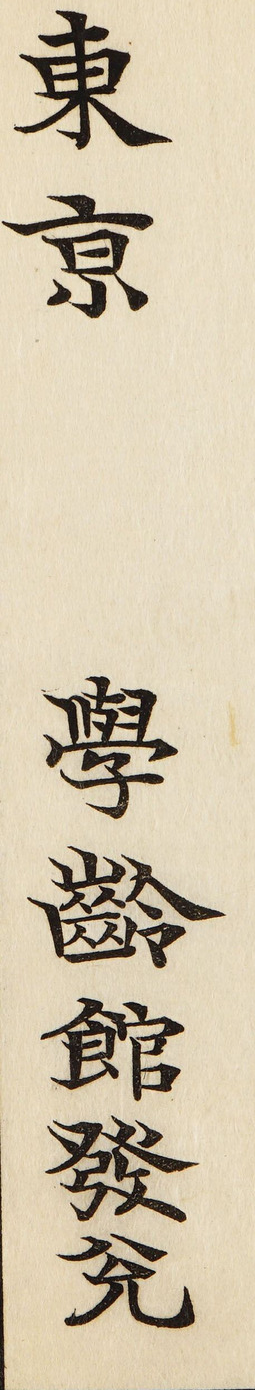東京学齢館発兌

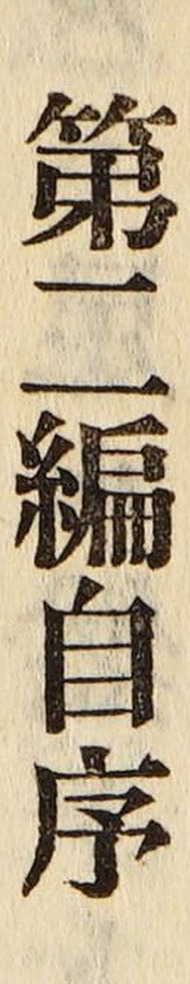第二編自序
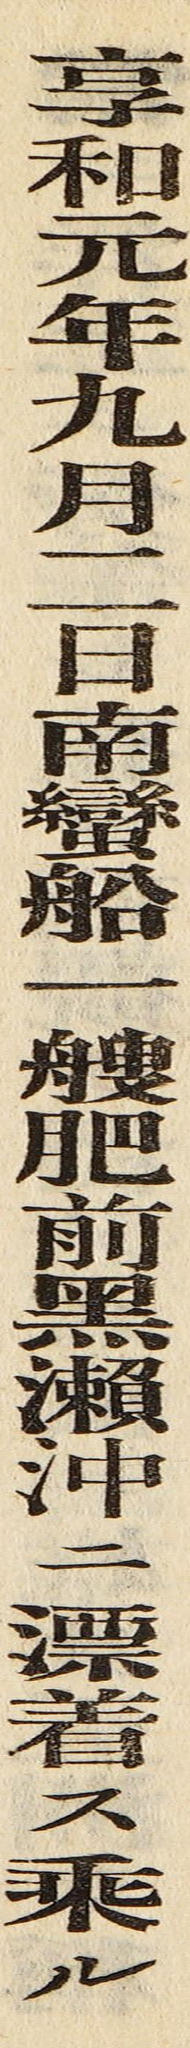享和元年九月二日南蛮船一艘肥前黒瀬沖ニ漂着ス乗ル
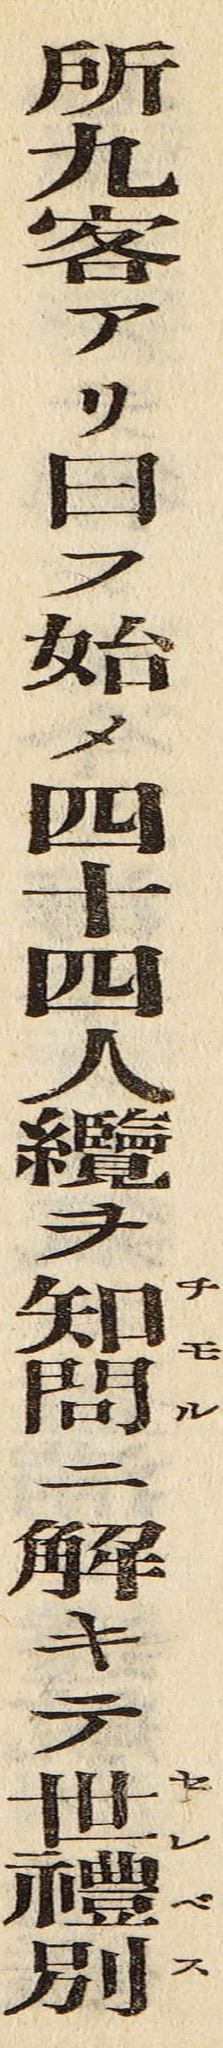所九客アリ曰フ始メ四十四人纜ヲ知問ニ解キテ世礼別
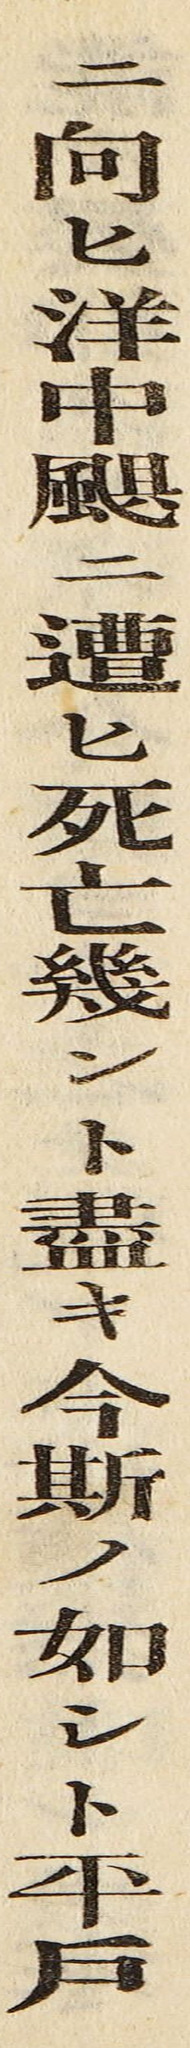ニ向ヒ洋中颶ニ遭ヒ死亡幾ント尽キ今斯ノ如シト平戸
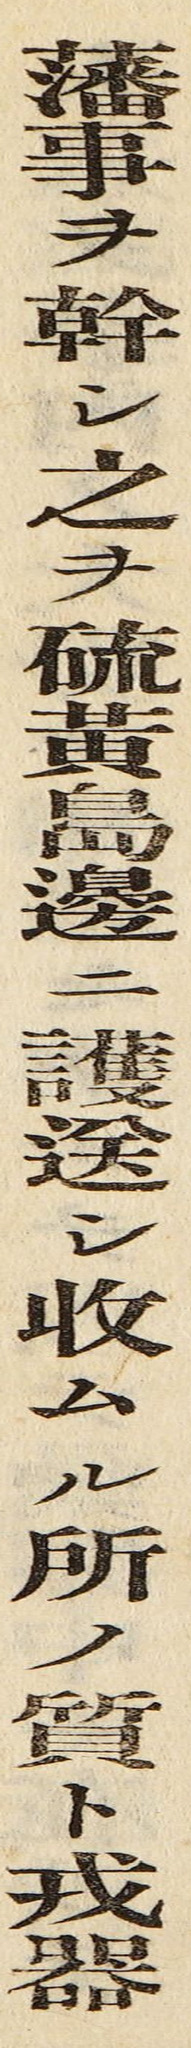藩事ヲ幹シ之ヲ硫黄島辺ニ護送シ収ムル所ノ質ト戎器
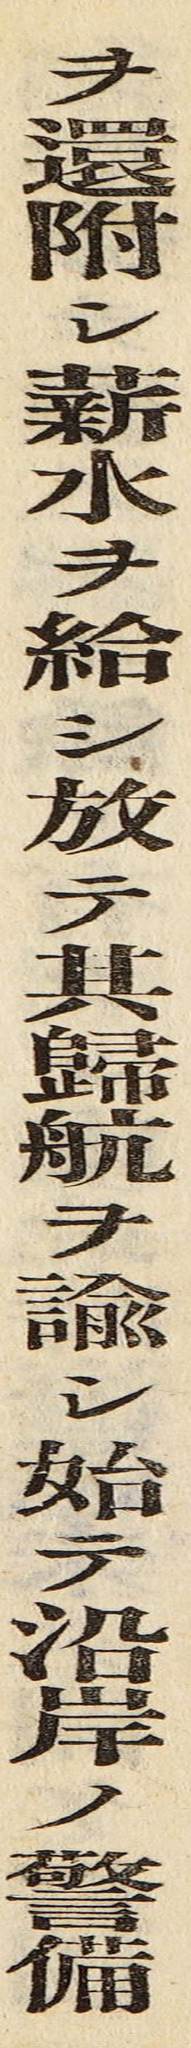ヲ還附シ薪水ヲ給シ放テ其帰航ヲ諭シ始テ沿岸ノ警備
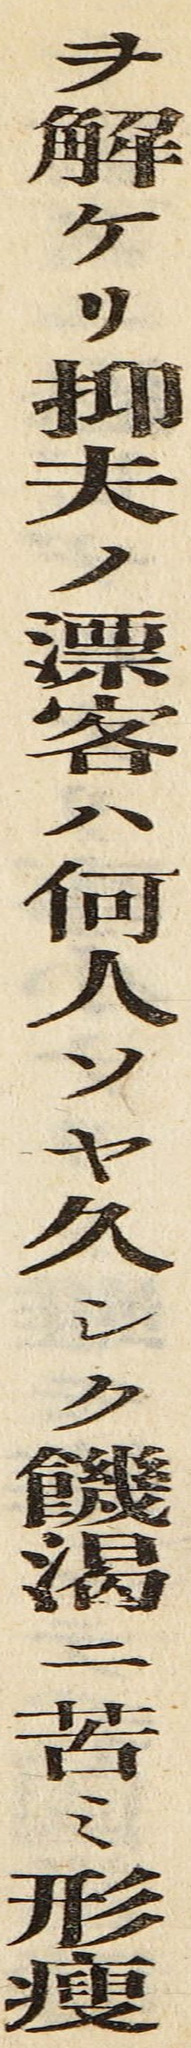ヲ解ケリ抑夫ノ漂客ハ何人ソヤ久シク饑渇ニ苦ミ形痩
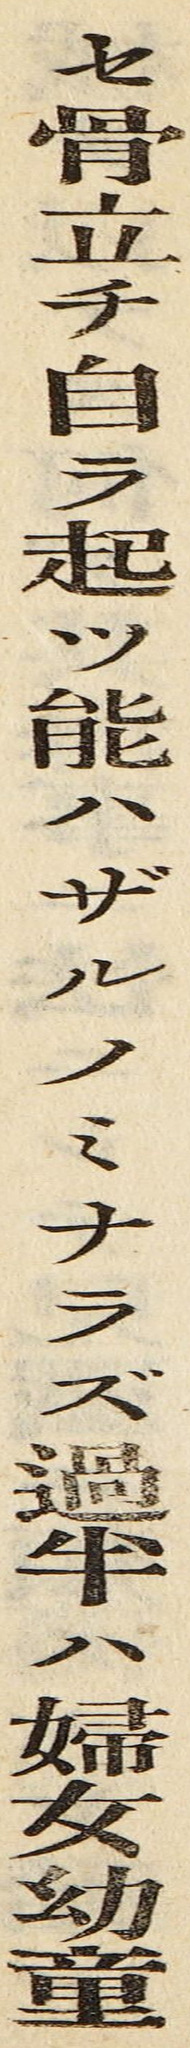セ骨立チ自ラ起ツ能ハザルノミナラズ過半ハ婦女幼童
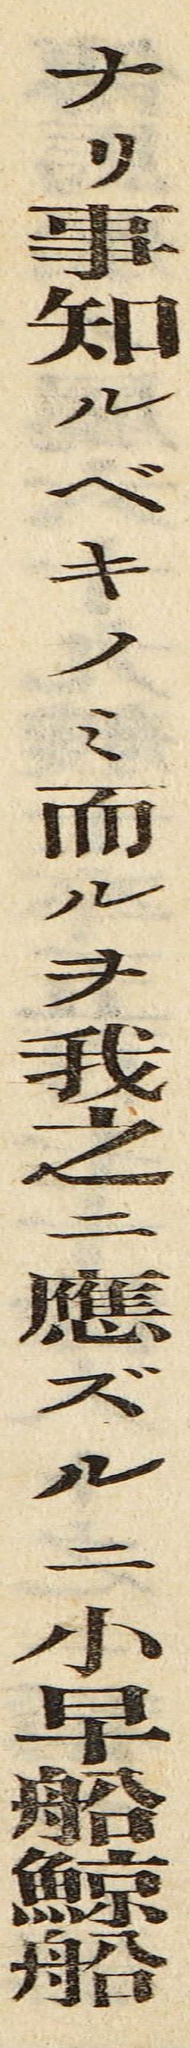ナリ事知ルベキノミ而ルヲ我之ニ応ズルニ小早船鯨船

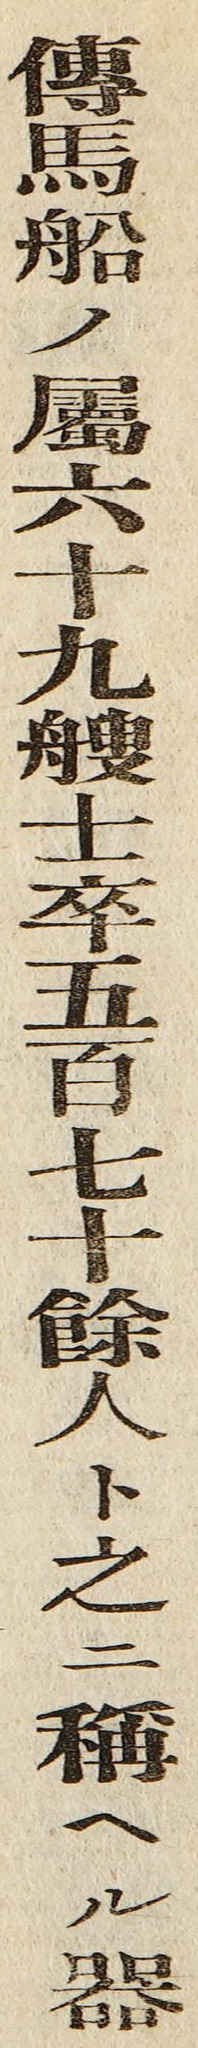伝馬船ノ属六十九艘士卒五百七十余人ト之ニ称ヘル器
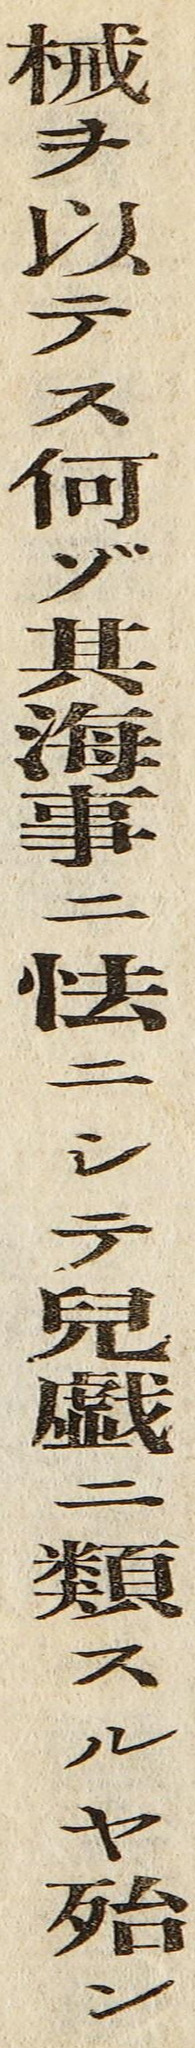械ヲ以テス何ゾ其海事ニ怯ニシテ児戯ニ類スルヤ殆ン
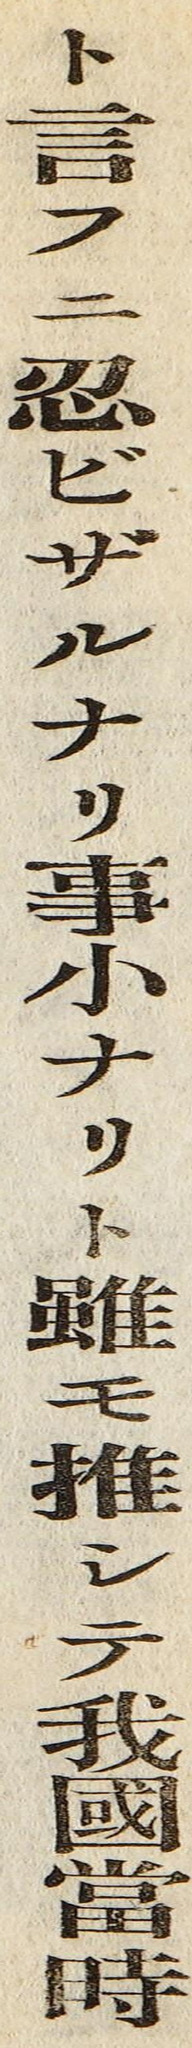ト言フニ忍ビザルナリ事小ナリト雖モ推シテ我国当時
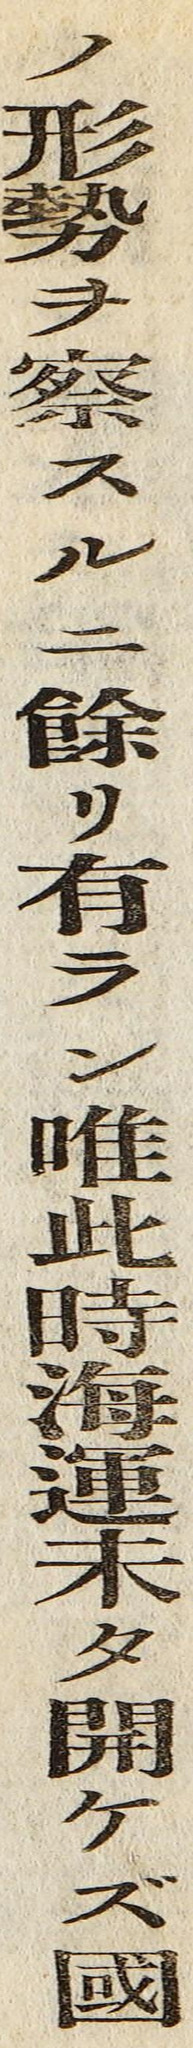ノ形勢ヲ察スルニ余リ有ラン唯此時海運未タ開ケズ国
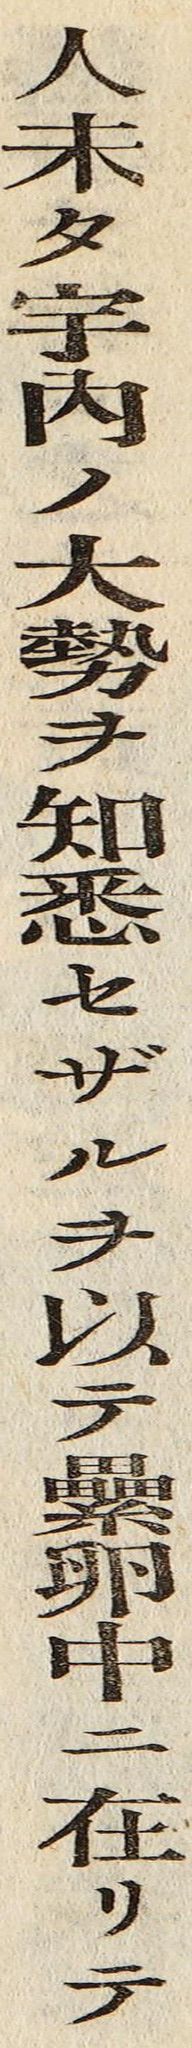人未タ宇内ノ大勢ヲ知悉セザルヲ以テ纍卵中ニ在リテ
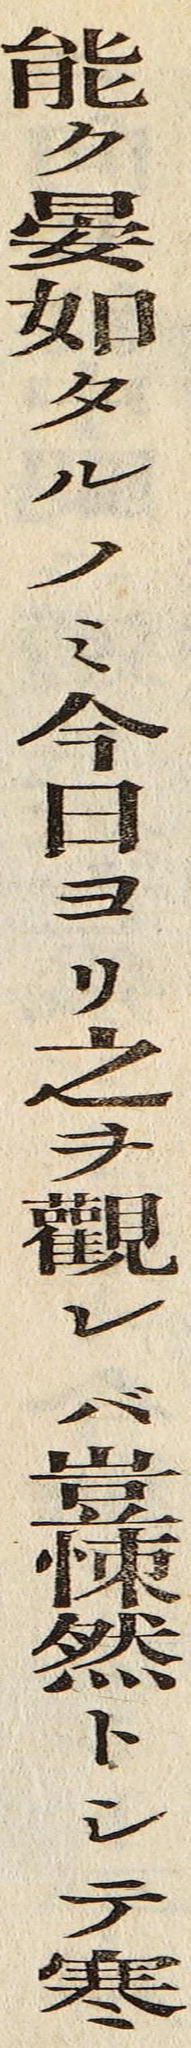能ク晏如タルノミ今日ヨリ之ヲ観レバ豈𢙀然トシテ寒
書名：日本漂流譚
